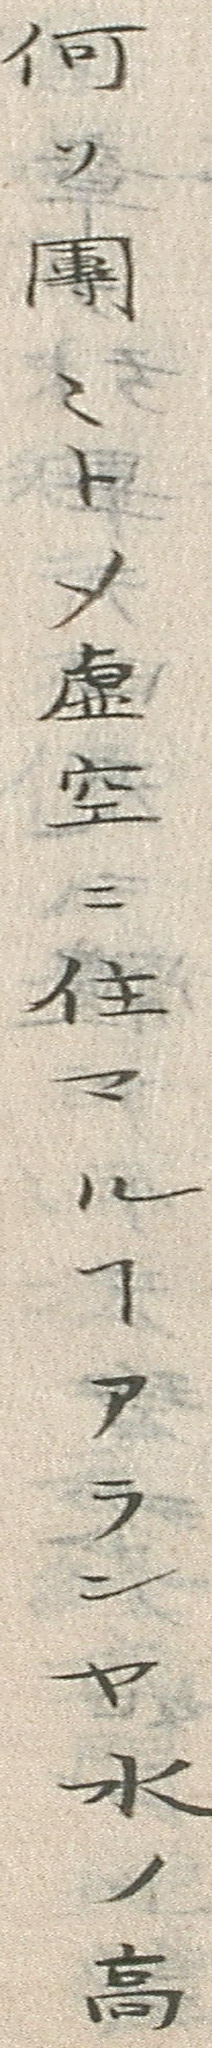何ソ団〻トシテ虚空ニ住マルコトアランヤ水ノ高
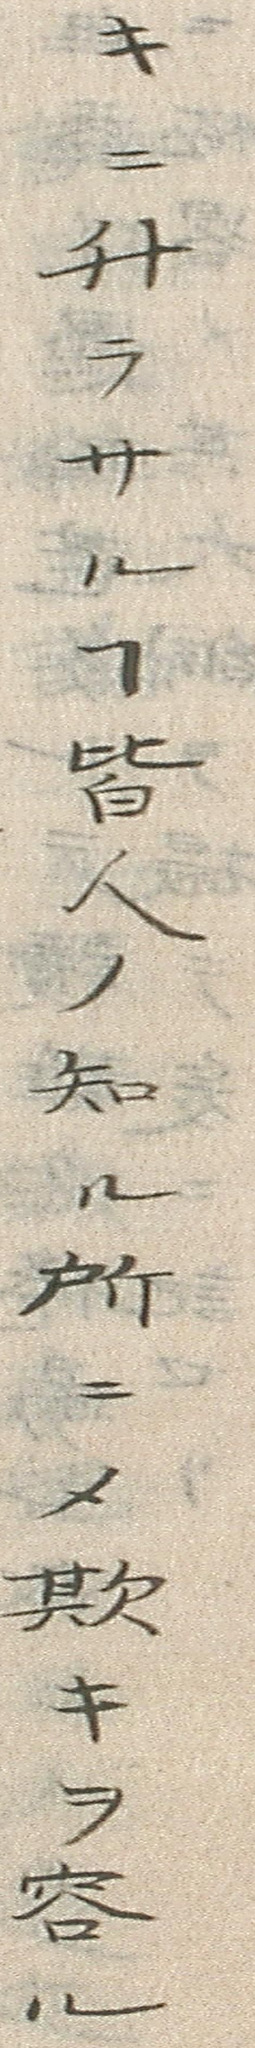キニ昇ラサルコト皆人ノ知ル所ニシテ欺キヲ容ル
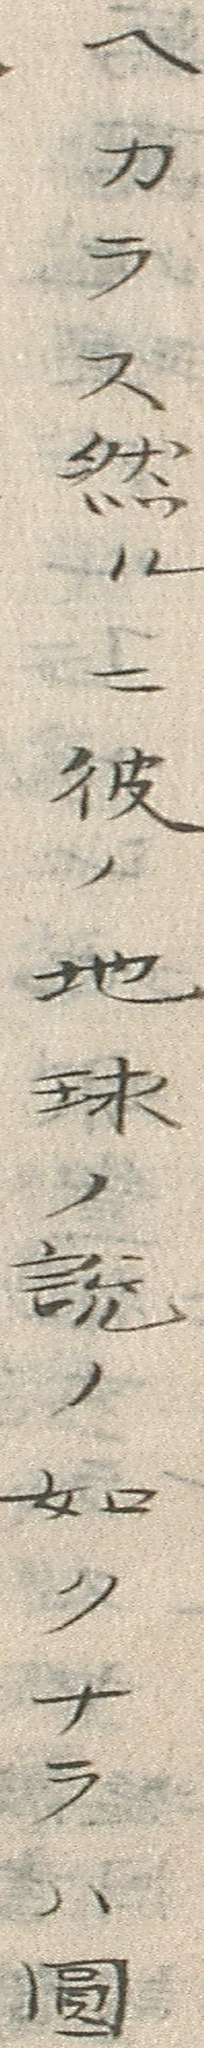ヘカラス然ルニ彼ノ地球ノ説ノ如クナラハ円
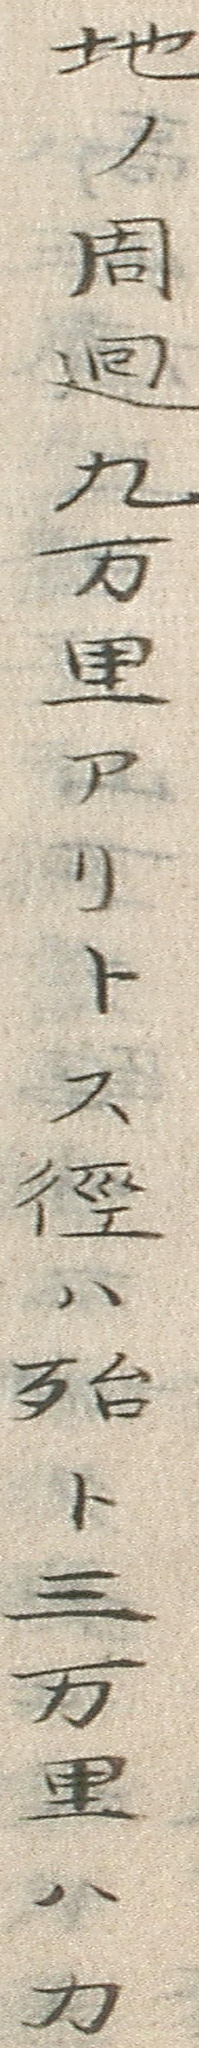地ノ周廻九万里アリトス径ハ殆ト三万里ハカ
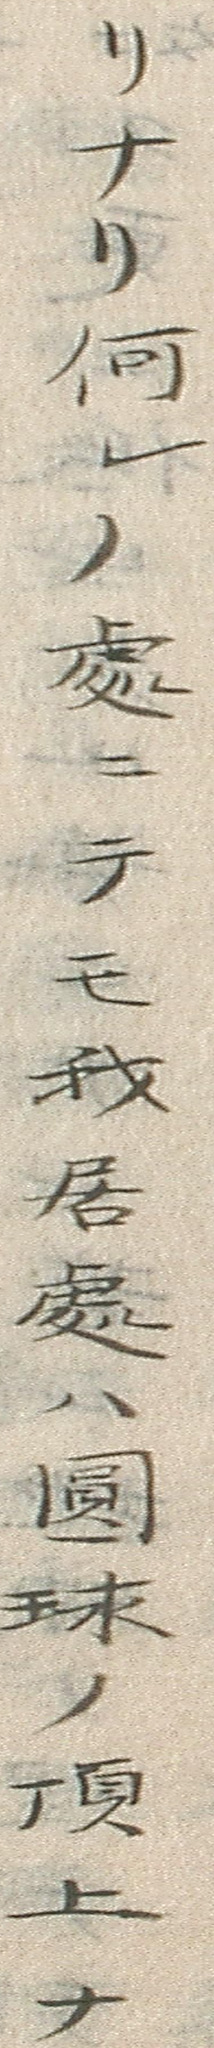リナリ何レノ処ニテモ我居処ハ円球ノ頂上ナ
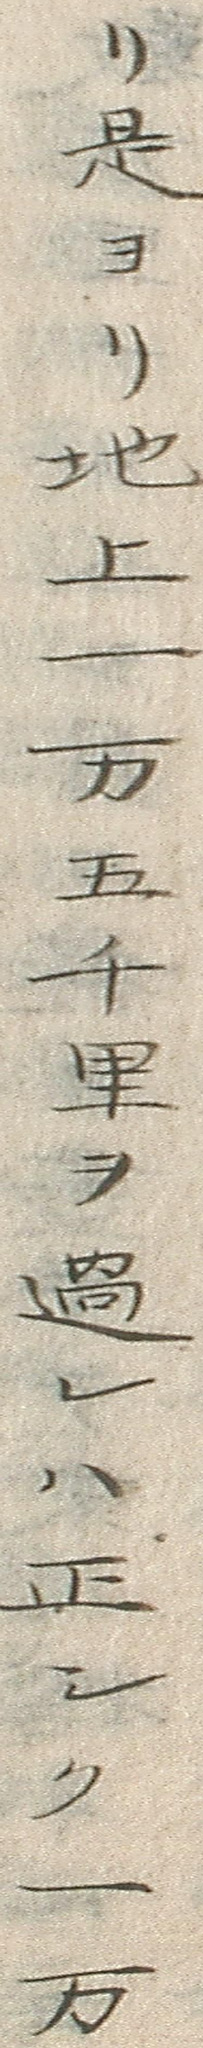リ是ヨリ地上一万五千里ヲ過レハ正シク一万
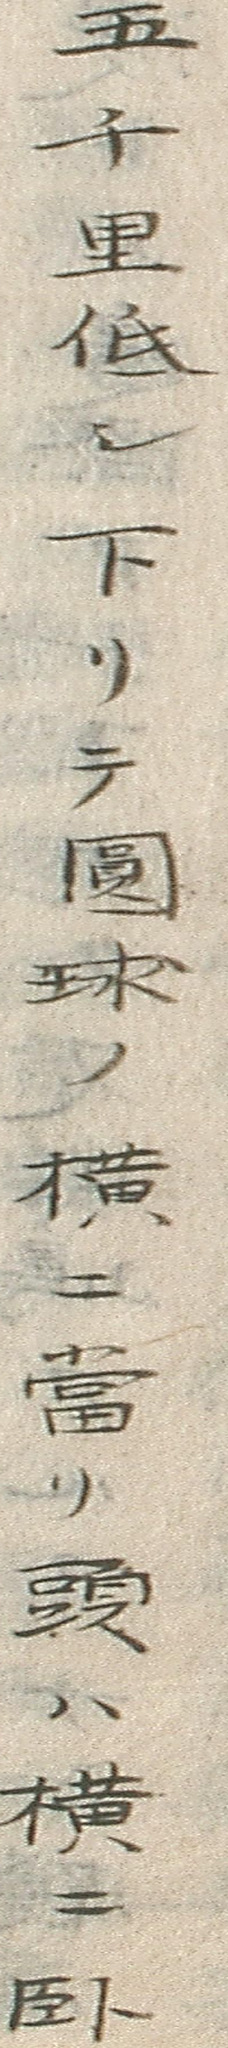五千里低シ下リテ円球ノ横ニ当リ頭ハ横ニ臥
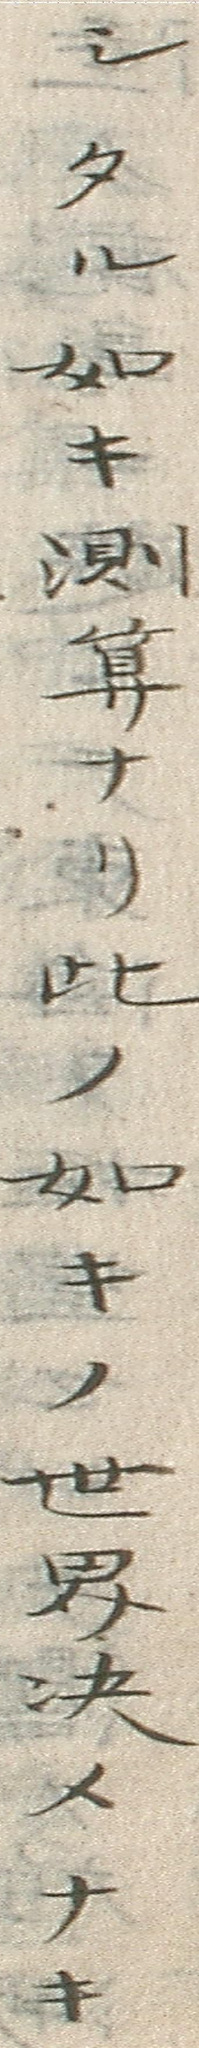シタル如キ測算ナリ此ノ如キノ世界决シテナキ
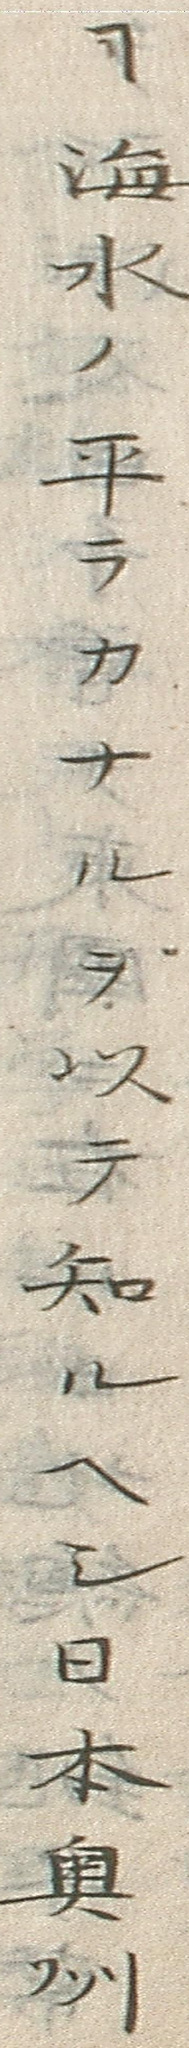コト海水ノ平ラカナルヲ以テ知ルヘシ日本奥州
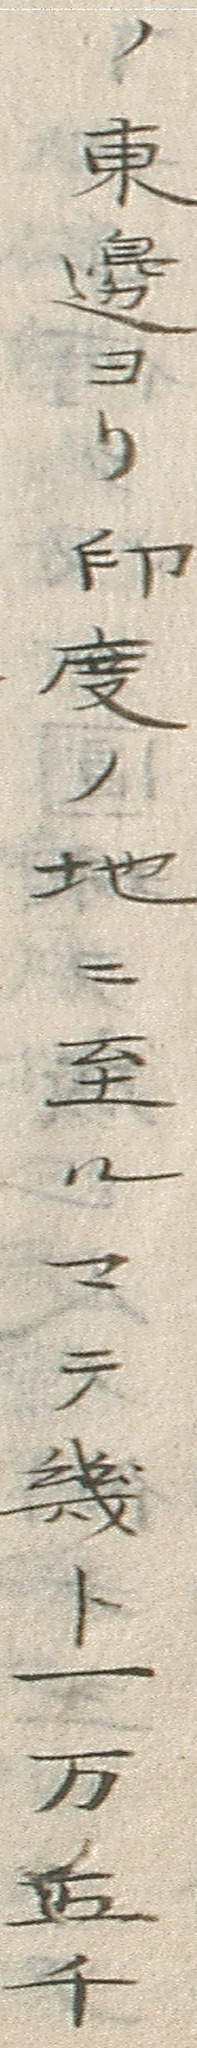ノ東辺ヨリ印度ノ地ニ至ルマテ幾ト一万五千
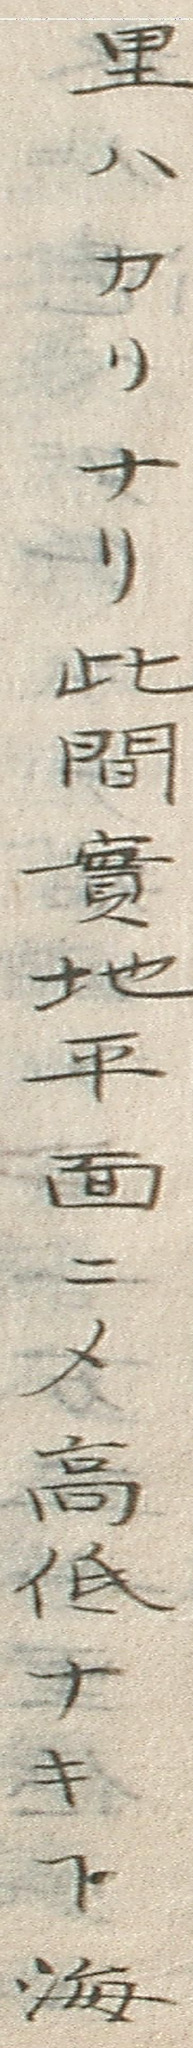里ハカリナリ此間実地平面ニシテ高低ナキト海

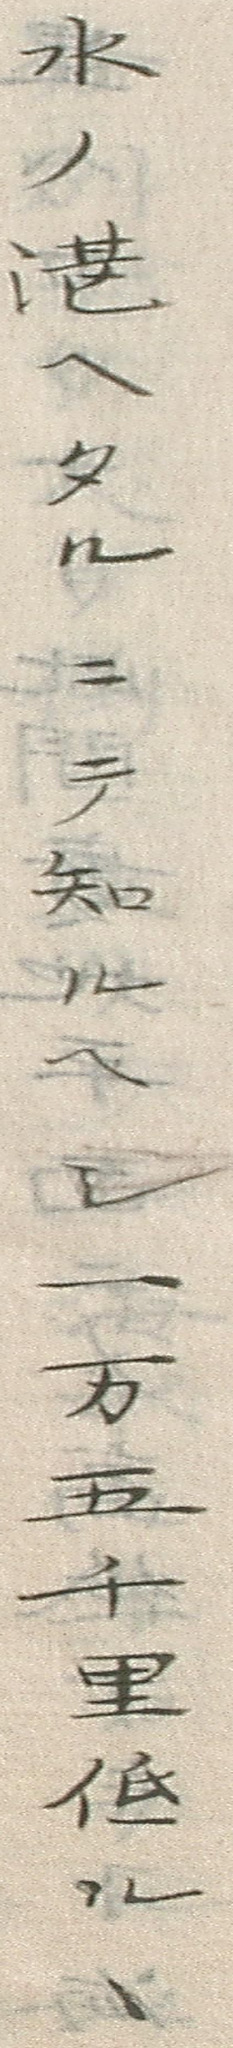水ノ湛ヘタルニテ知ルヘシ一万五千里低ルヽ
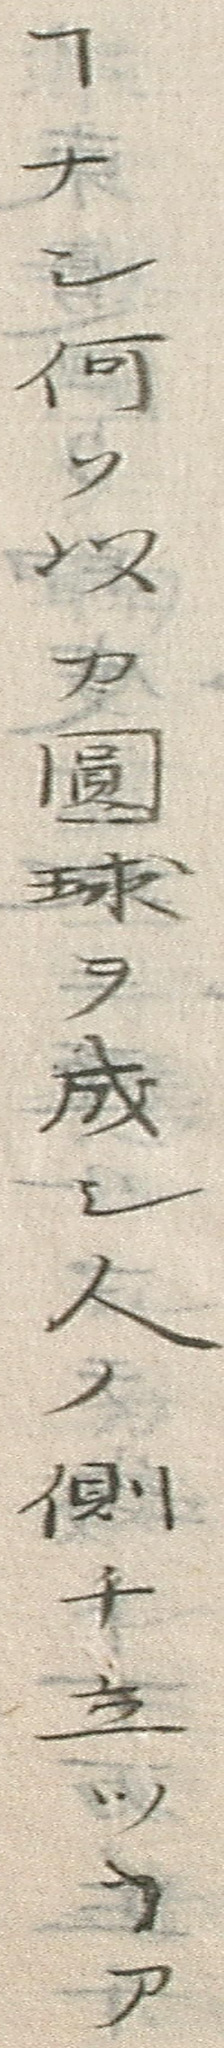コトナシ何ソ以カ円球ヲ成シ人ノ側チ立ツコトア
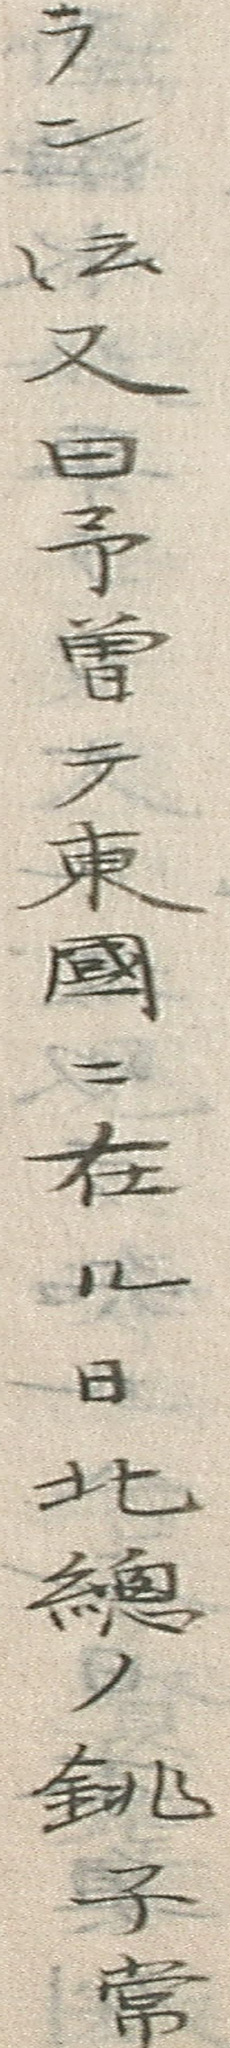ラン云〻又曰予曽テ東国ニ在ル日北総ノ銚子常
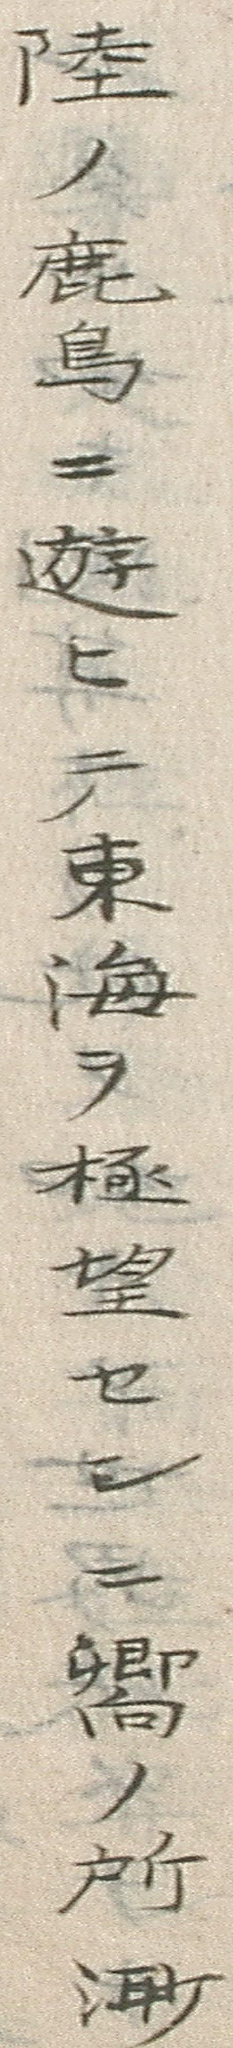陸ノ鹿島ニ遊ヒテ東海ヲ極望セシニ嚮ノ所渺
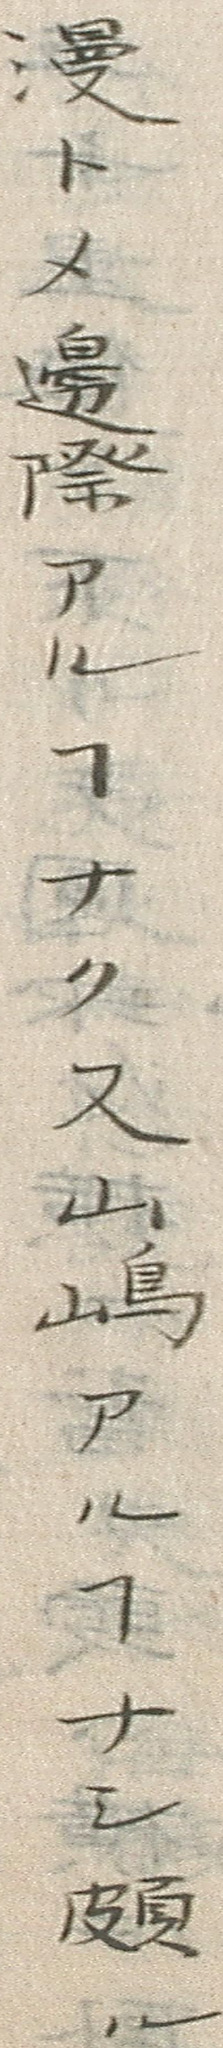漫トシテ辺際アルコトナク又山嶋アルコトナシ頗ル
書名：天學略名目羽翼　全
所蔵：東京大学地震研究所図書室 Earthquake Research Institute Library, The University of Tokyo, JAPAN
